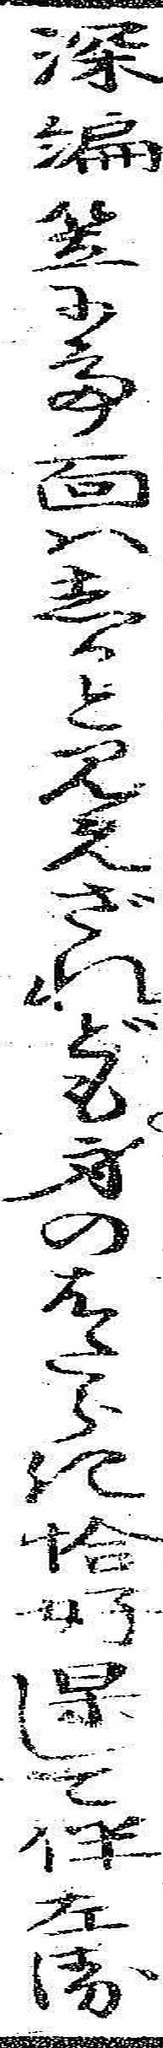深編笠にて面はしかと見えざれども。身のはたらき恰好果して伴左衛
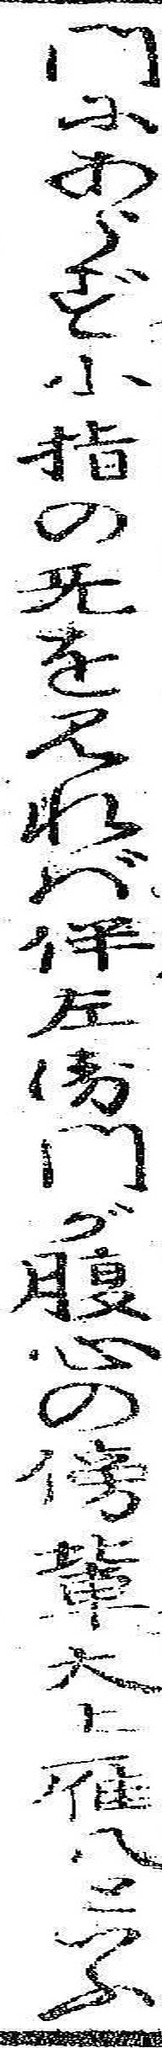門にあらず。小指の無を見れば。伴左衛門が腹心の傍輩犬上雁八といふ
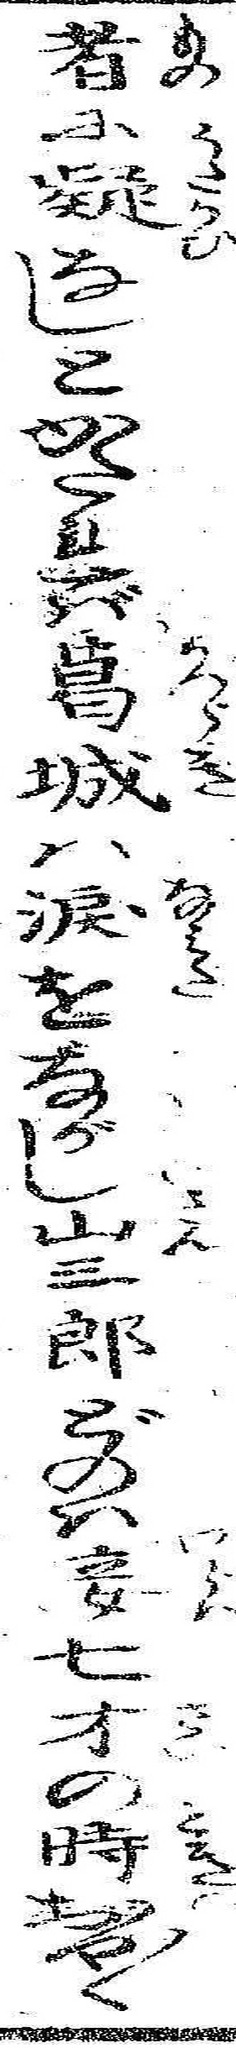者に疑なしとかたれば。葛城は涙をながし。山三郎どのは妾七才の時おや〳〵
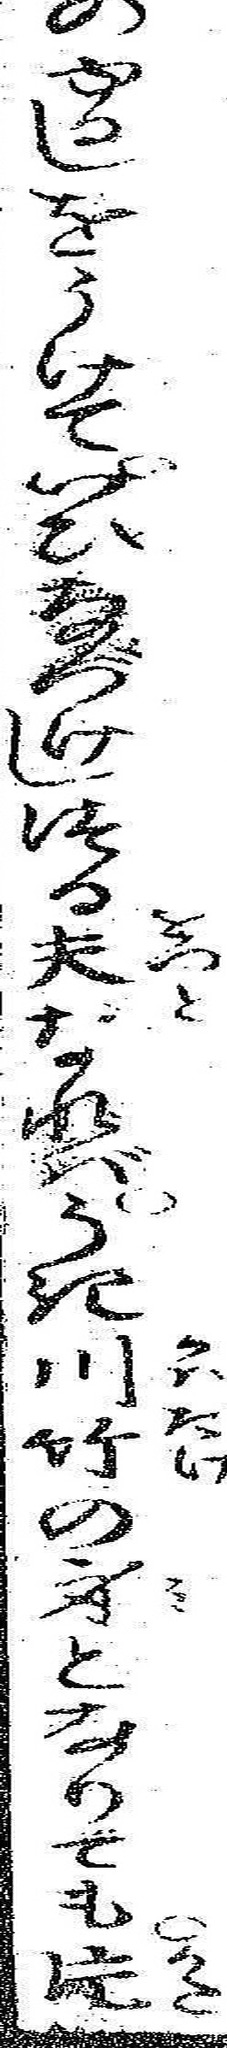のゆるしをうけて。いひなづけしつる夫なれば。うき川竹の身となりても。片
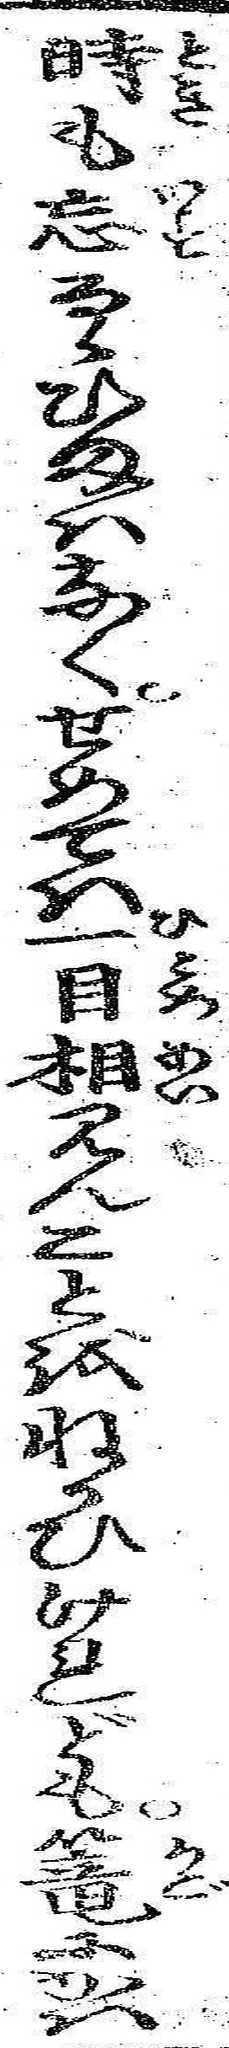時も忘るゝひまはなく。せめては一目相見んことをねかひけれども。篭にかは
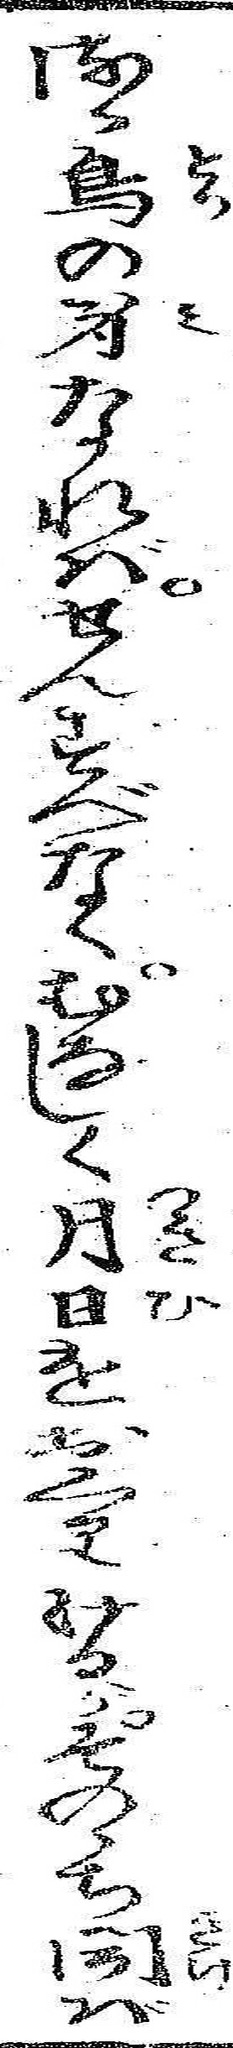るゝ鳥の身なれば。せんすべなく。むなしく月日をおくりけるが。そのゝち聞ば
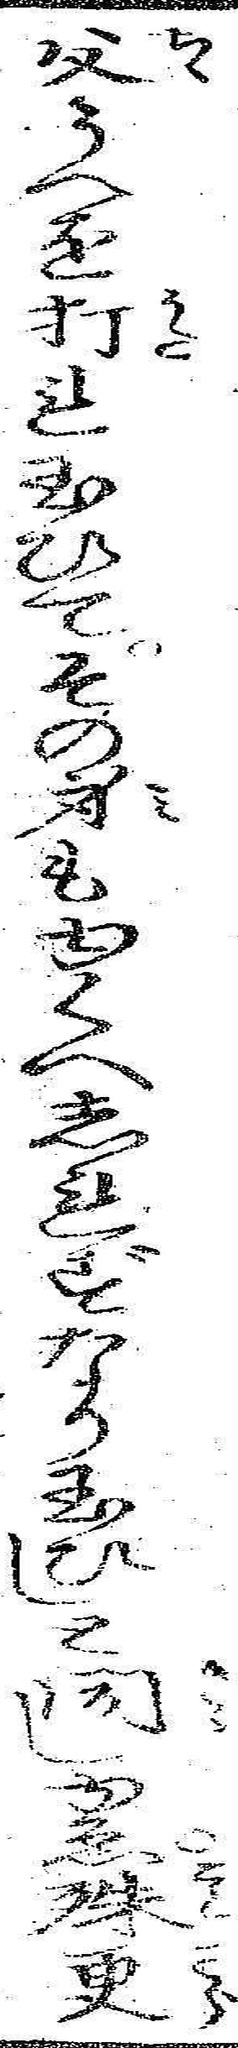父うへを打れ玉ひて。その身もゆくへしれずなり玉ひしと聞しゆゑ。殊更
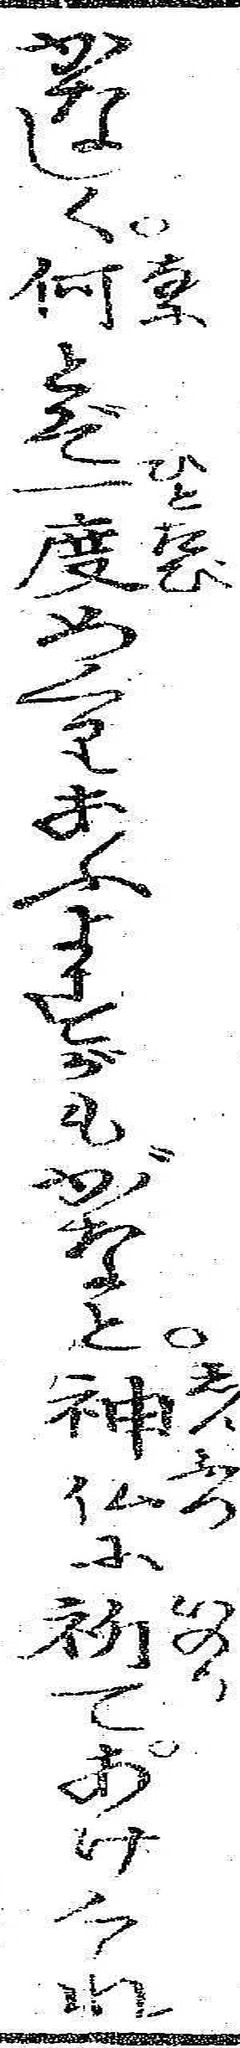かなしく。何とぞ一度めぐりあふよすがもがなと。神仏に祈て。あけくれ
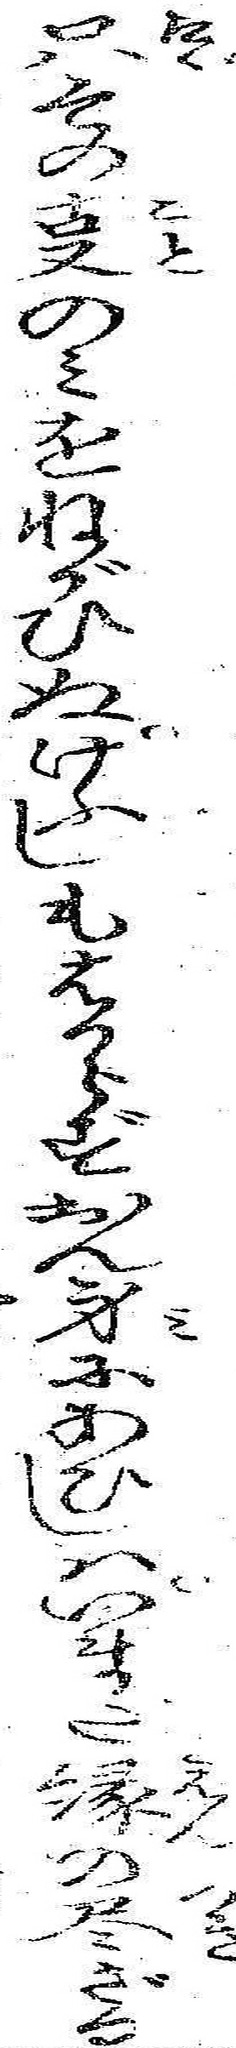只その事のみをねがひぬ。けふしもはからずおん身にあひしは。いまだ縁の尽ざる
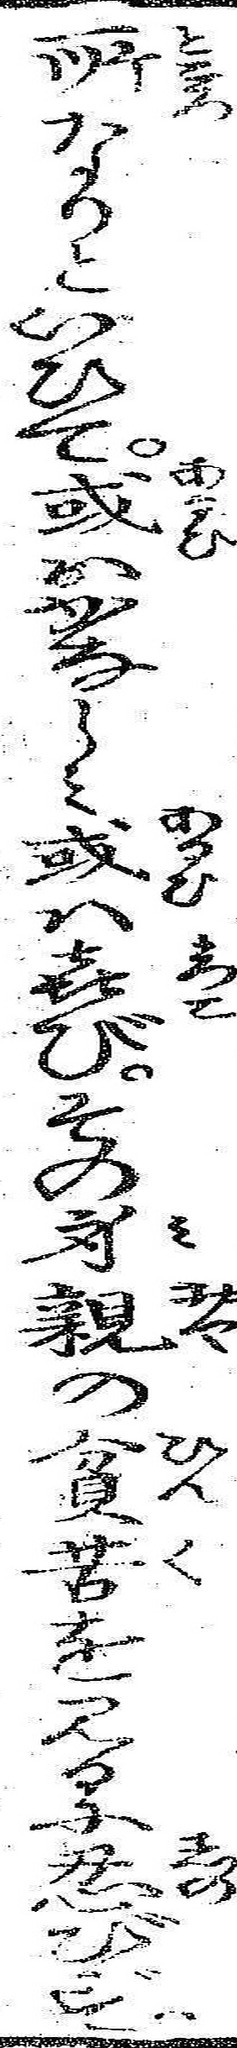所なりといひて。或はかなしみ或は喜び。その身親の貧苦を見るに忍びず。
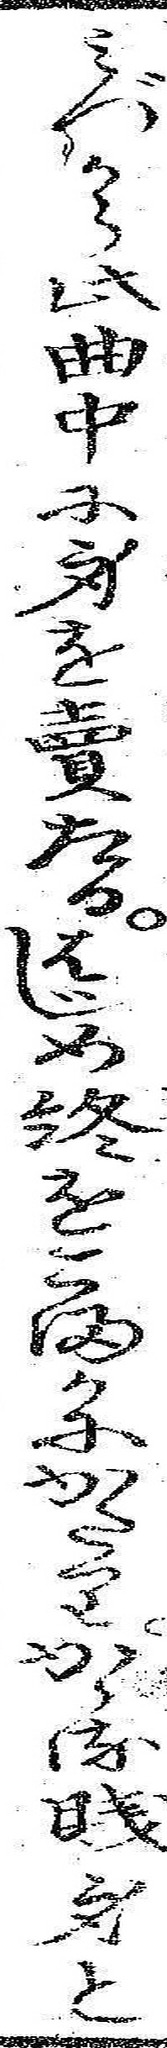みづから此曲中に身を売たる。はじめ終をこまかにかたり。かゝる賎身と
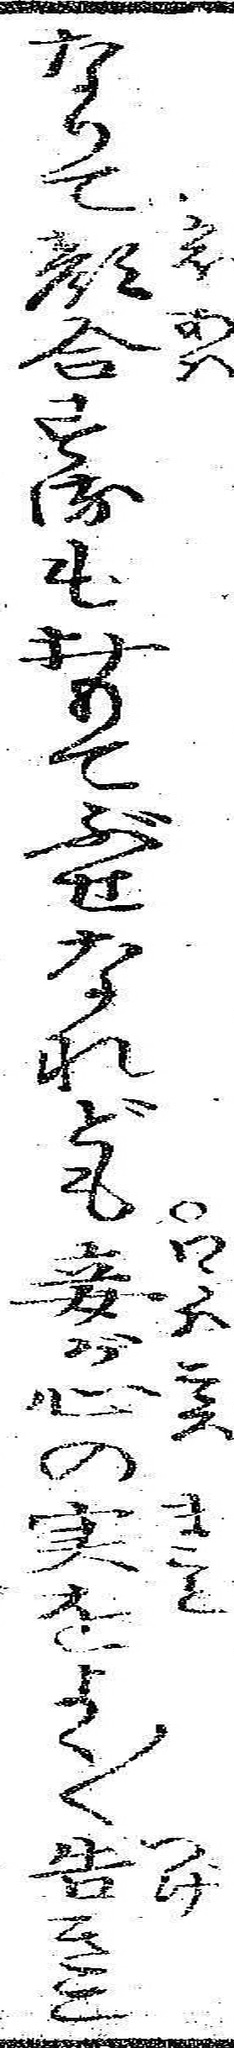なりて。顔合するもおもてぶせなれども。妾が心の実をよく〳〵告きこ
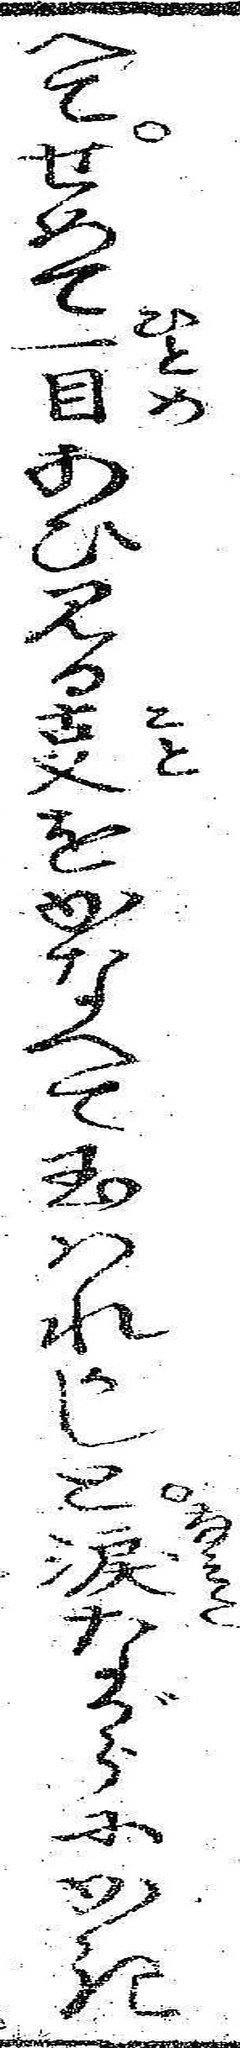へて。せめて一目あひ見る事をかなへて玉はれかしと。涙ながらにかき
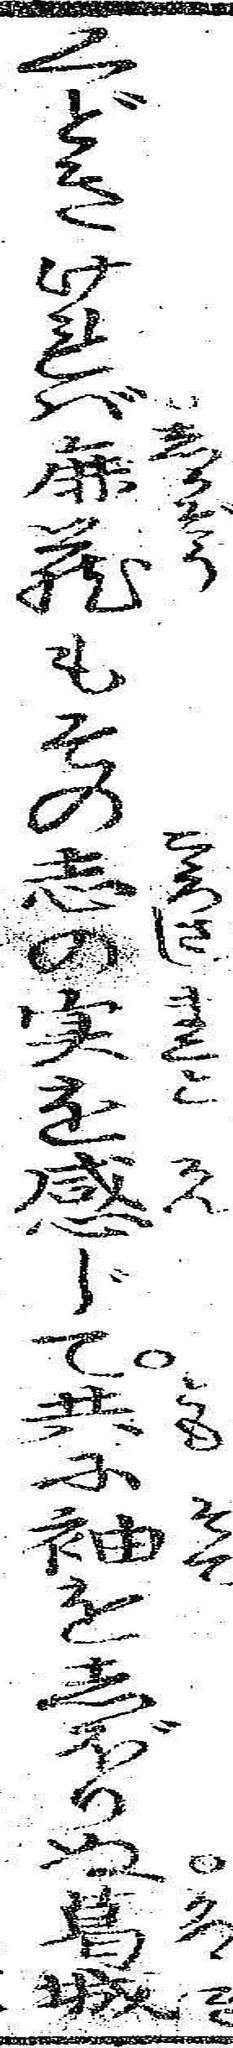くどきければ。鹿蔵もその志の実を感じて。共に袖をしぼりぬ。葛城
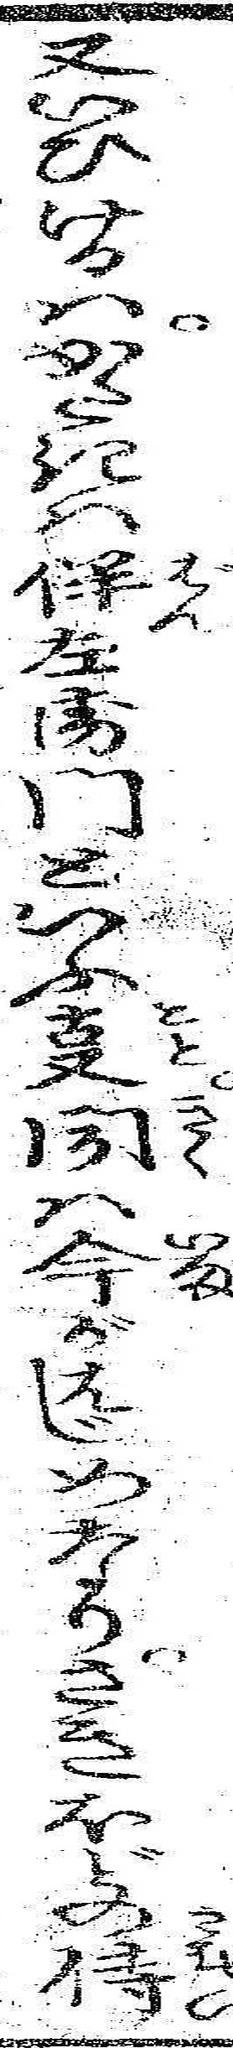又いひけるは。かたきは伴左衛門といふ事。聞は今がはじめなり。さきほどの侍

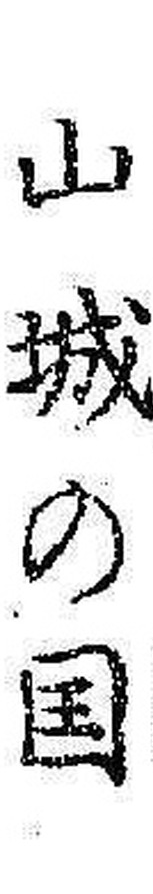山城の国
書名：昔話稲妻表紙
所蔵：国文学研究資料館
